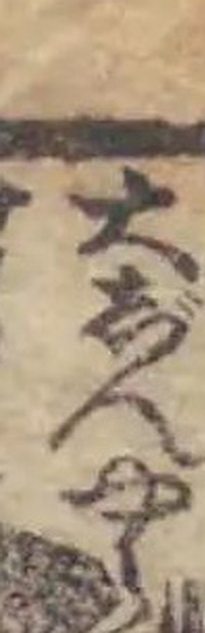大じんやら
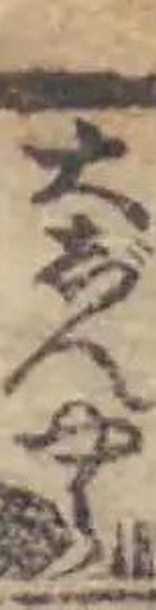大じんやら
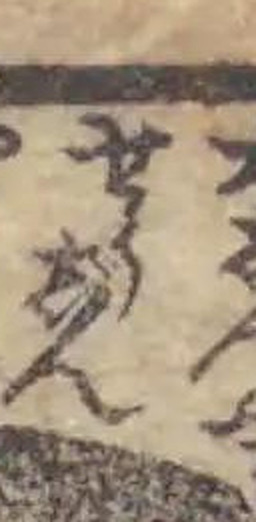せうじん
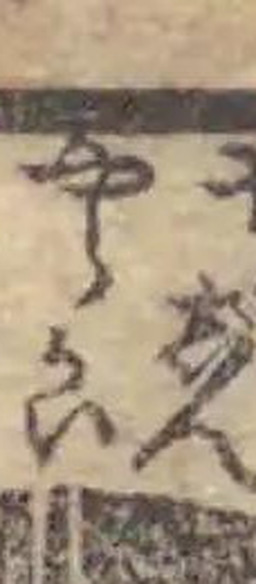やらかい
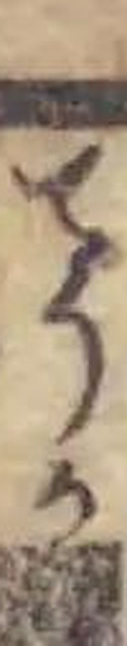てうか
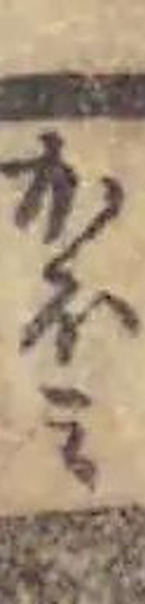かほミ
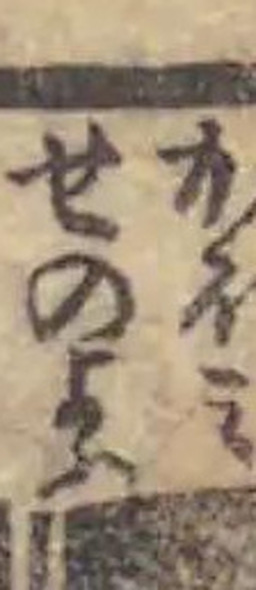せのよふ
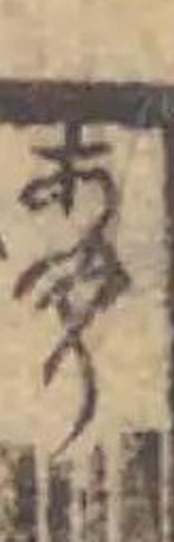あまり
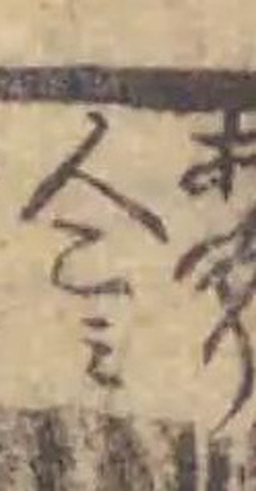人こミ
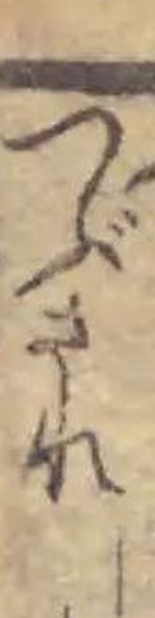つぶされ
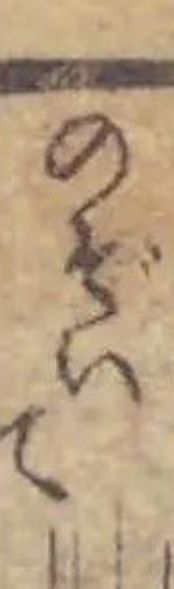のぞいて
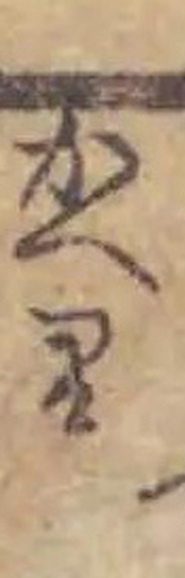かへり
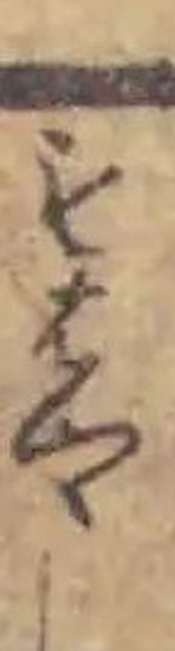もはや
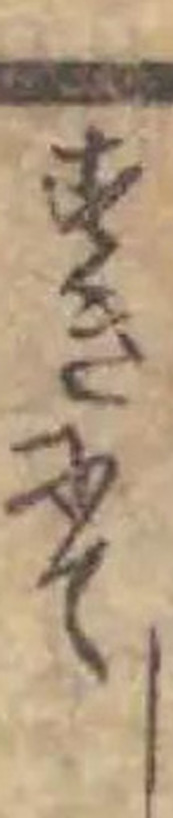すきにて
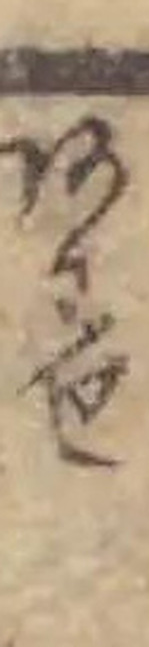あわせ
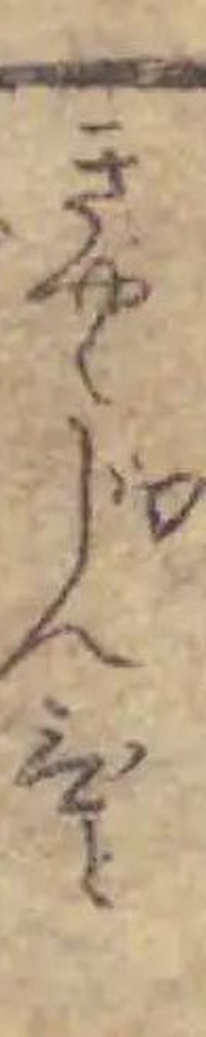きやたじんひと
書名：豆男江戸見物 2巻
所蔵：国立国会図書館 National Diet Library, JAPAN
